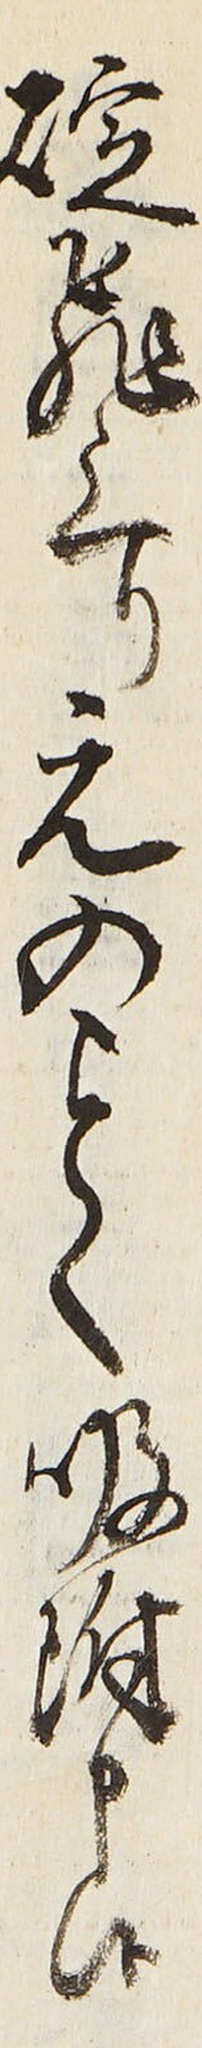碇飛上り元のことく吸附申候
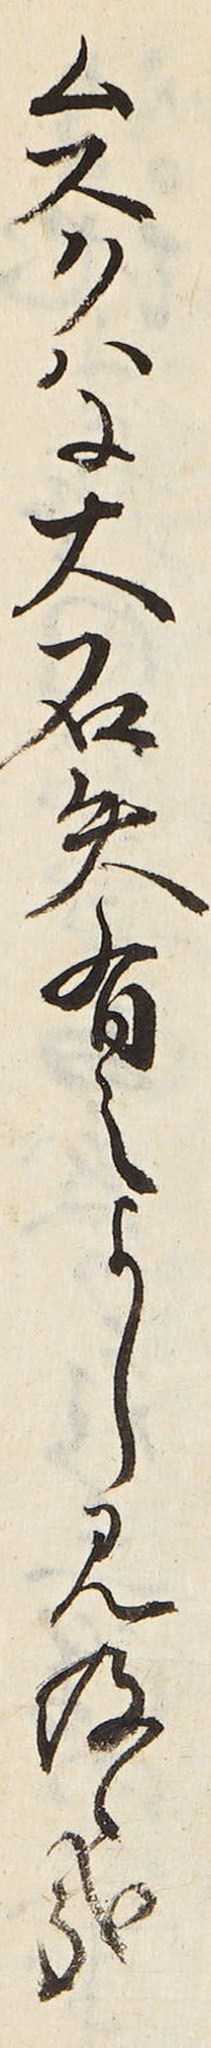ムスクハに大石矢有之よし見及候哉
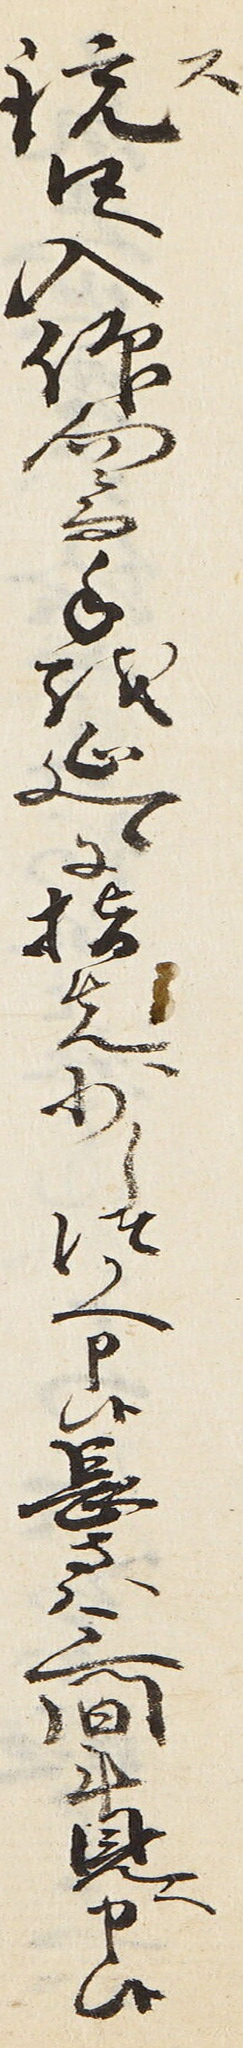銃口へ入仰向にて手を延候に指先少しつかへ申候長さは三間計見へ申候
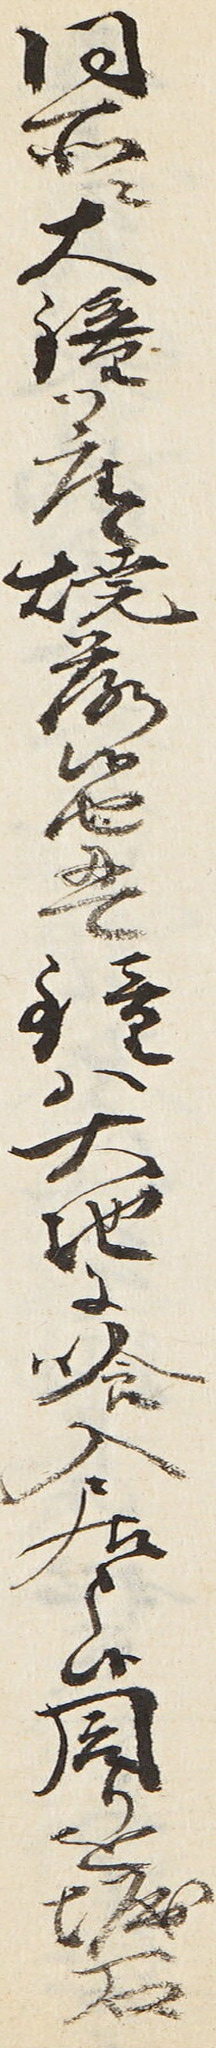同所に大鐘御座候焼落候由にて鐘は大地に喰入居申候周りを堀石
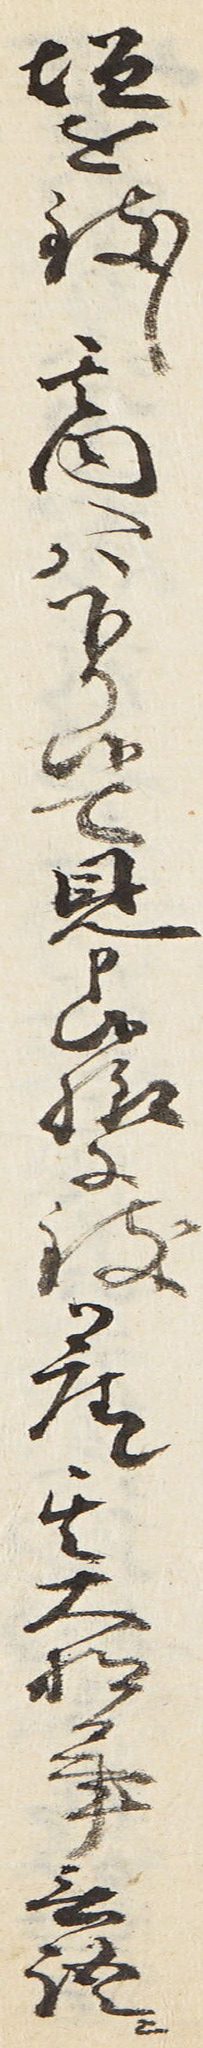垣を致し其内へは下り候て見申候様に致御座候其大なる事言語に
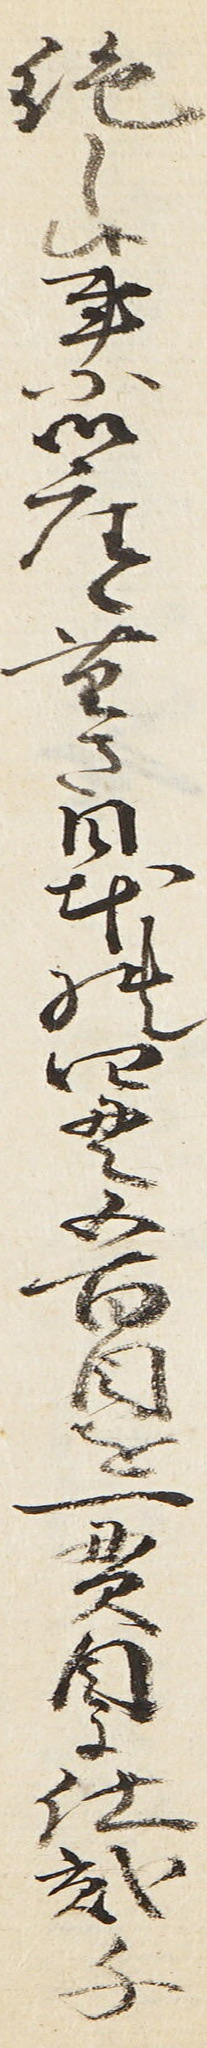絶し候事に御座候重さ日本の四貫五百目を一貫目に仕弐千
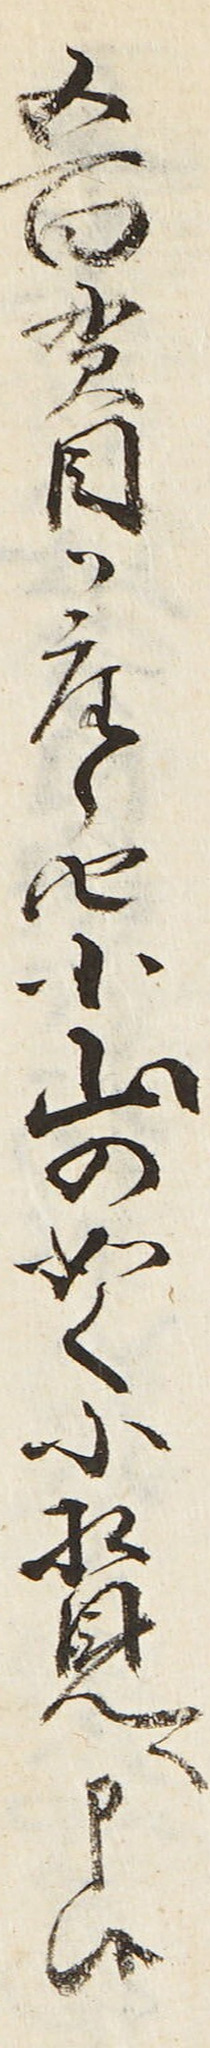五百貫目御座候由小山の如くに相見へ申候
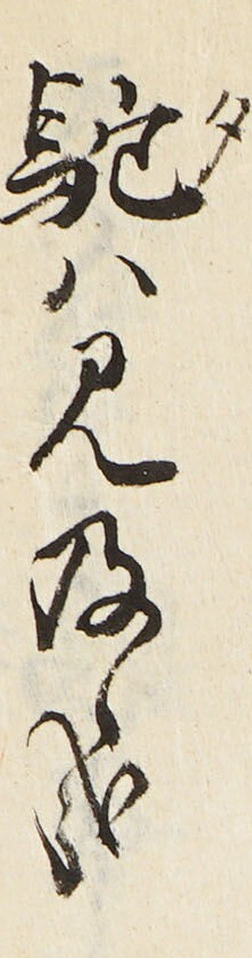駝は見及候哉

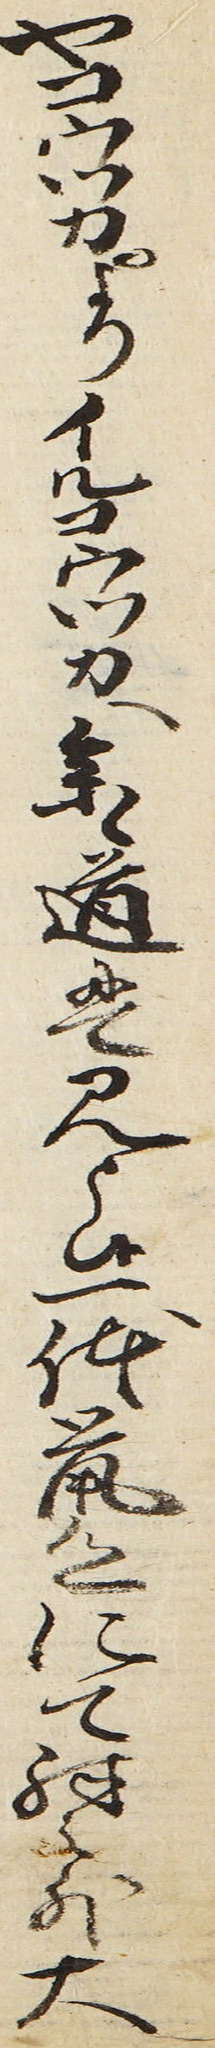ヤコウツカ。よりイルコウツカへ参候道にて見申候一体鼠色にて殊之外大
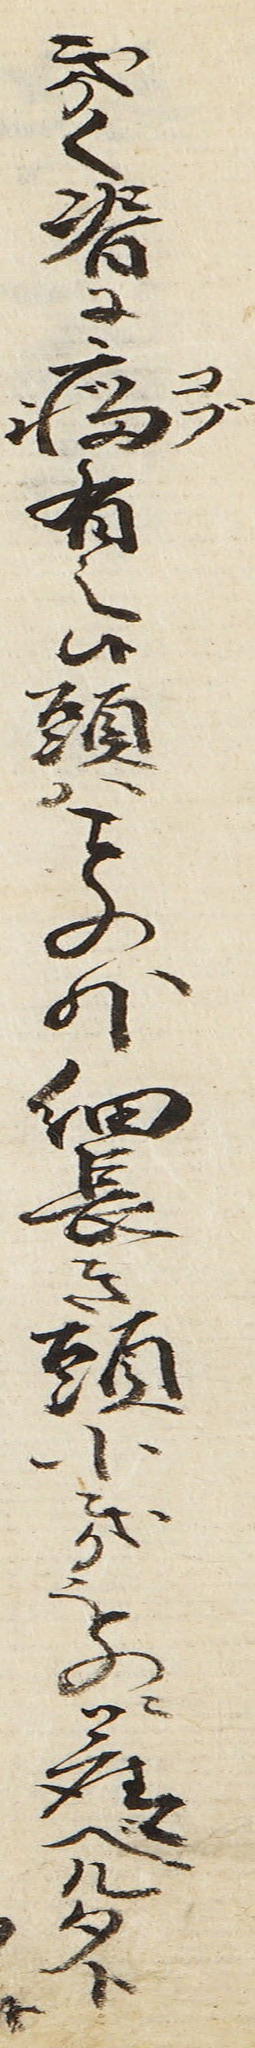きく脊に瘤有之候頭はことの外細長き頭小きものに御座候ベルタと申候
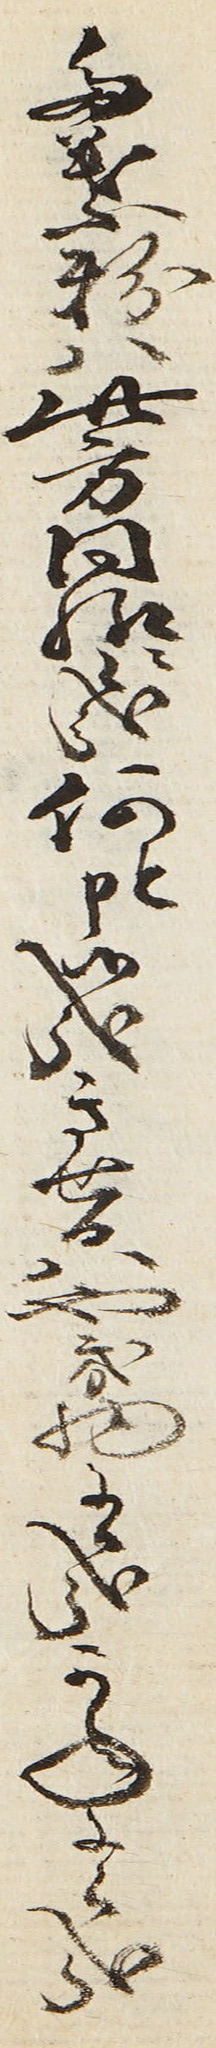多葉粉は此方同様に候哉何と申候哉きせるはやき物に候哉かねに候哉
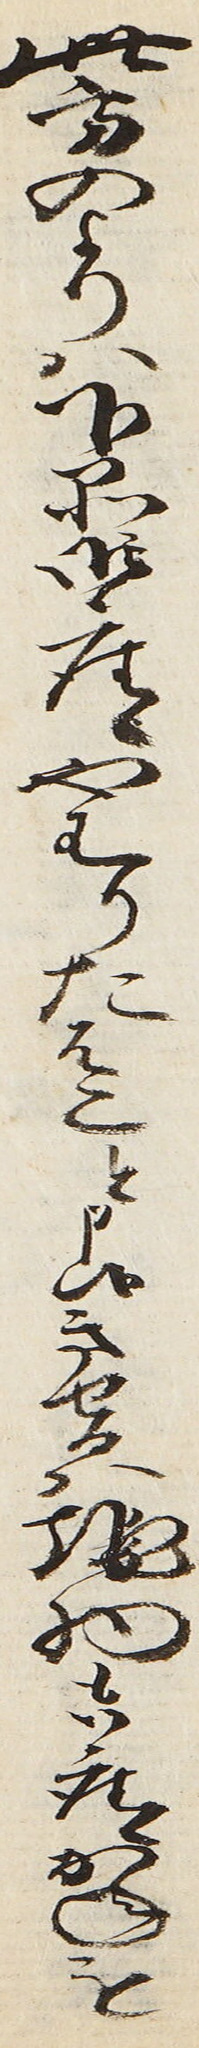此方のよりは下品御座候やはりたはこと申候きせるは焼物も御座候かねも
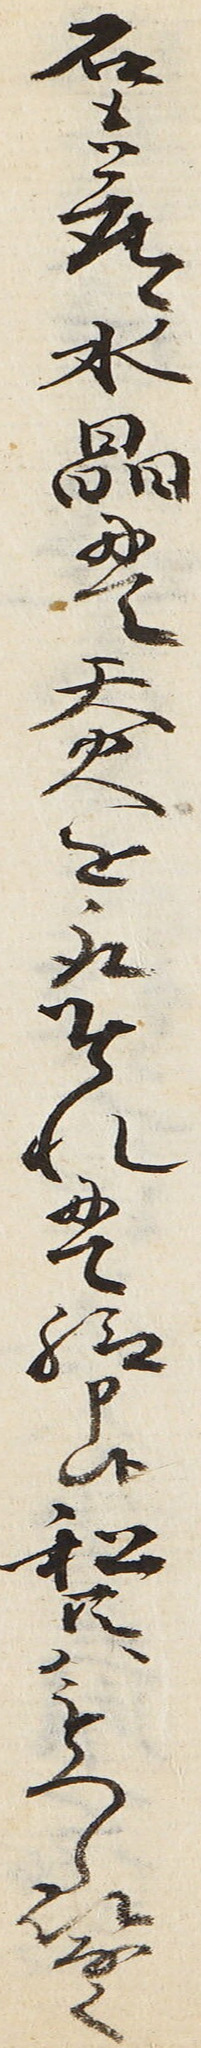石も御座候水晶にて天火を取それにて給申候私共はもつたいなく
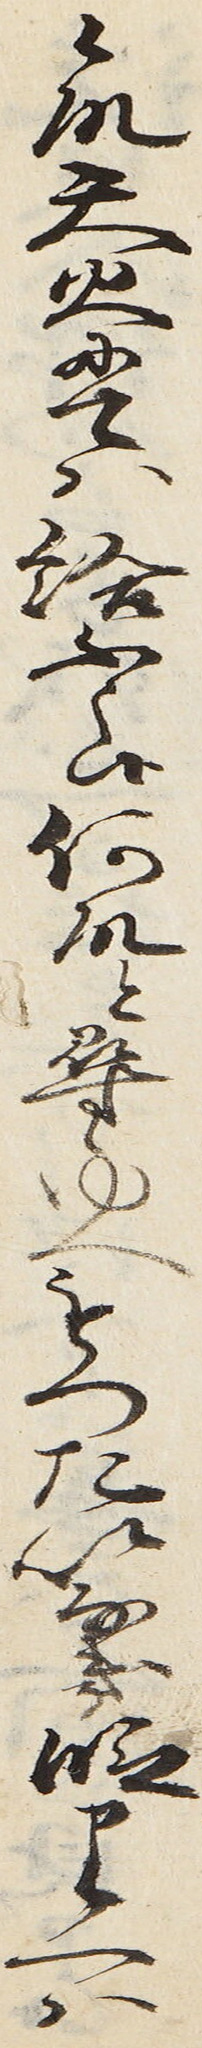候故天火にては給不申候何故と尋候ゆへもつたいなき段申候へは
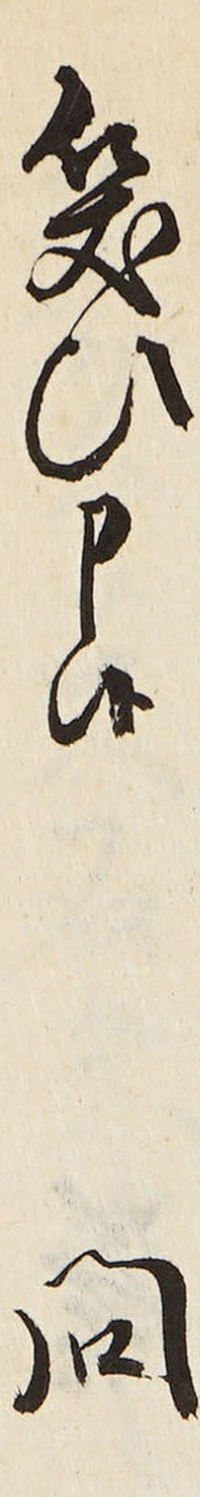笑ひ申候問
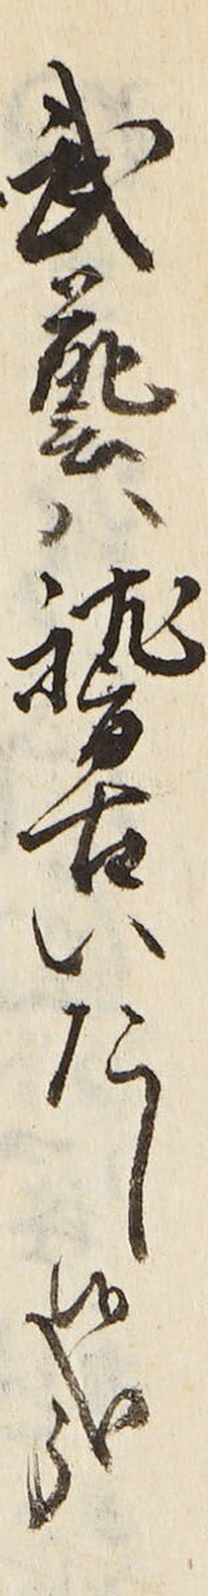武芸は稽古いたし候哉
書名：漂民御覧之記
